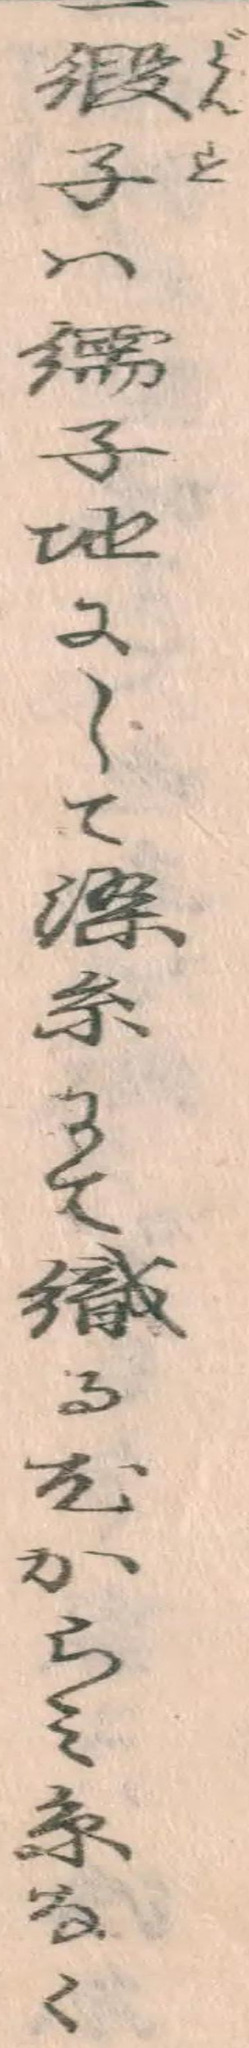一緞子は繻子地にして染糸にて織る尤からみ糸なく
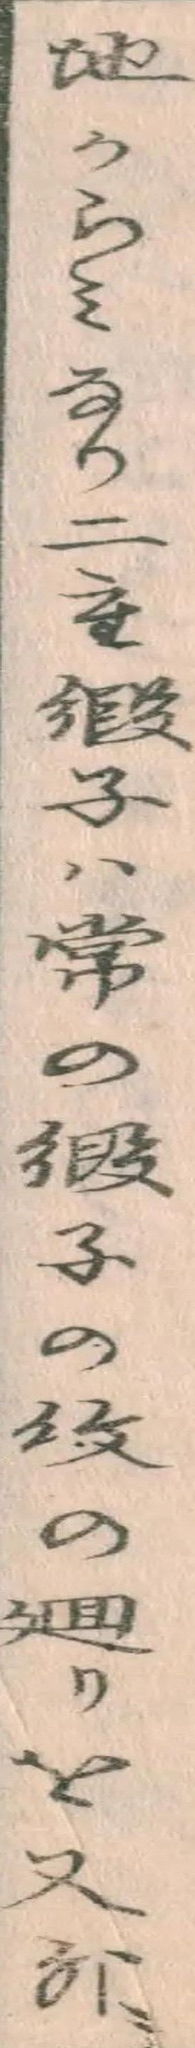地からみなり二重緞子は常の緞子の紋の廻りを又外に
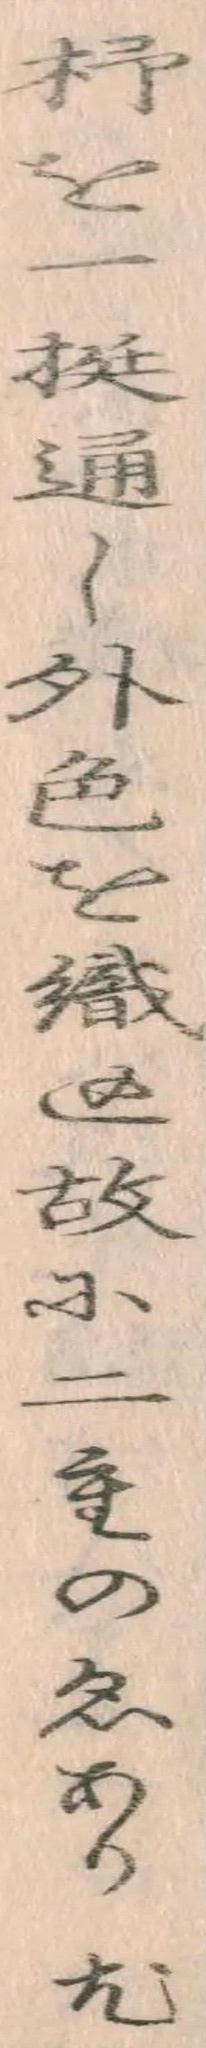杼を一挺通し外色を織込故に二重の名あり尤
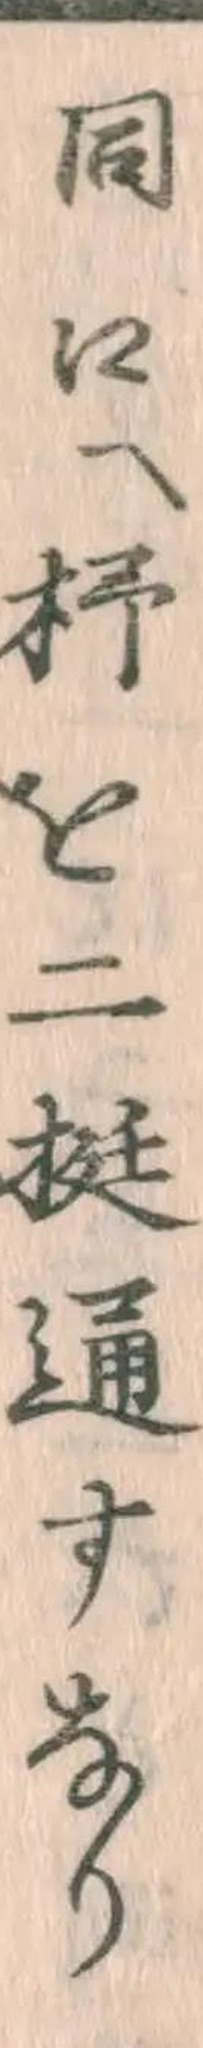同口へ杼を二挺通すなり
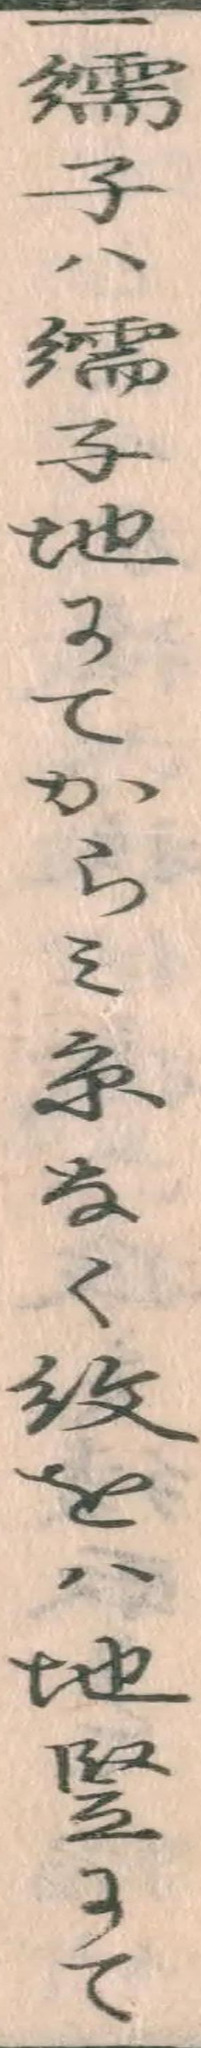一繻子は繻子地にてからみ糸なく紋をは地竪にて
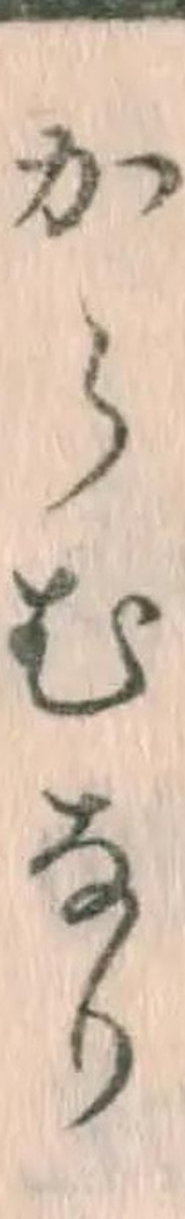からむなり
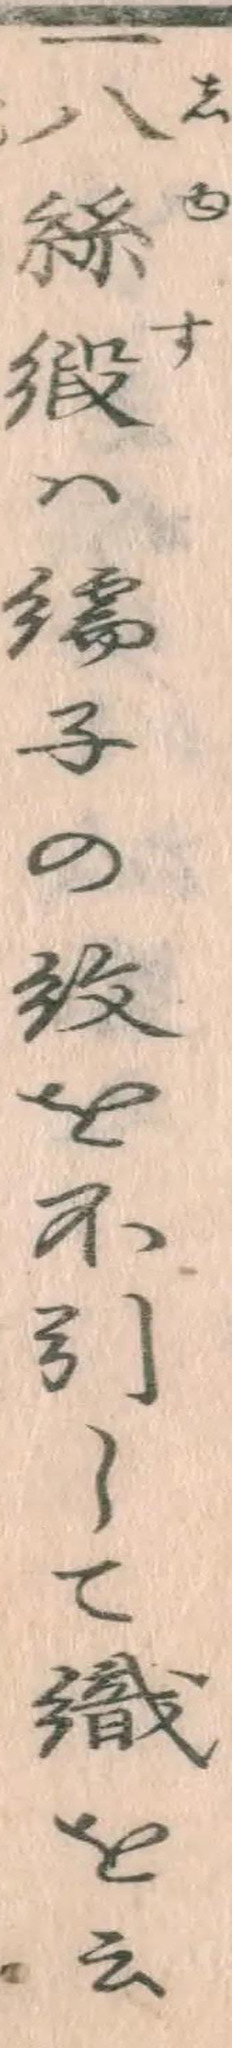一八糸緞は繻子の紋を不引して織を云
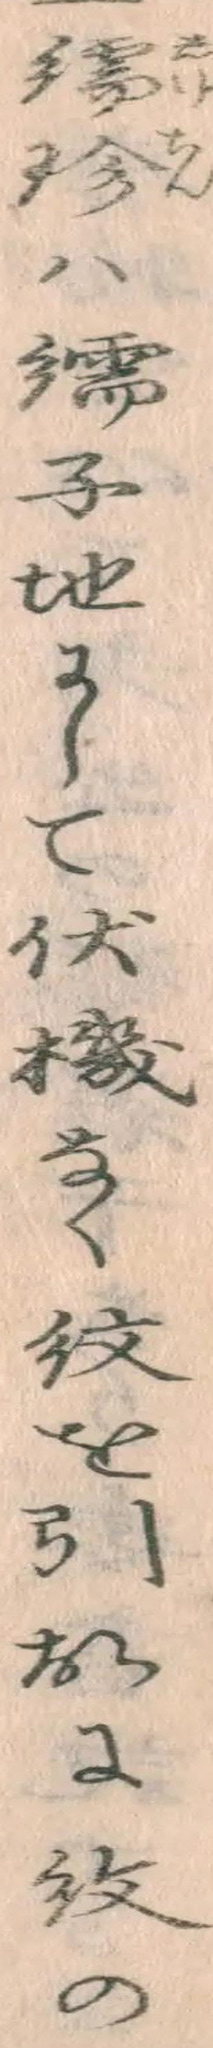一繻珍は繻子地にして伏機なく紋を引故に紋の
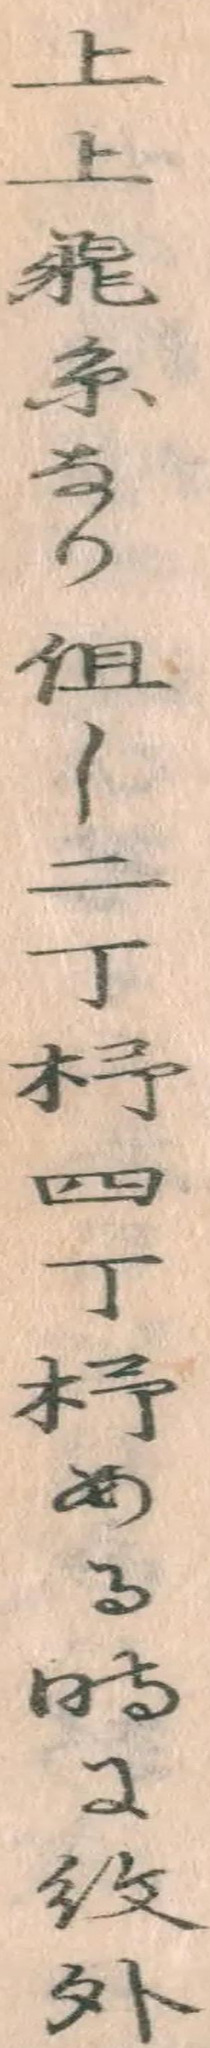上上飛糸なり但し二丁杼四丁杼ある時に紋外
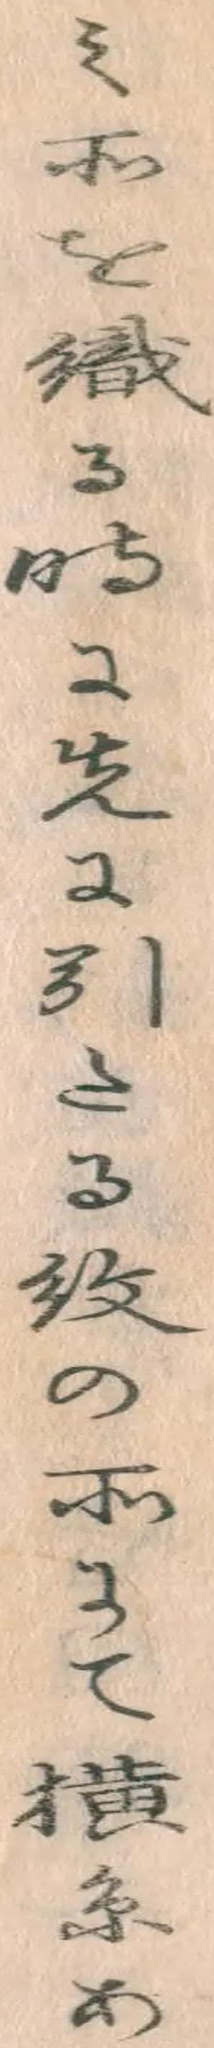之所を織る時に先に引たる紋の所にて横糸あ
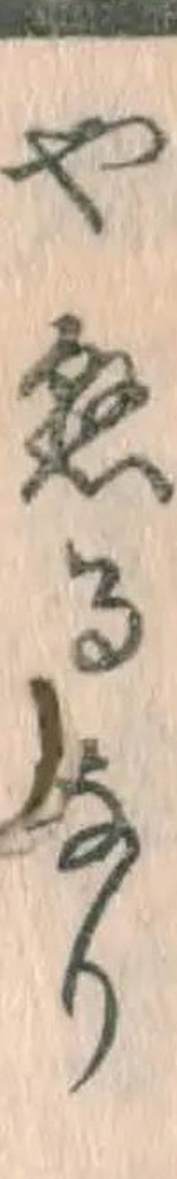や懸るなり
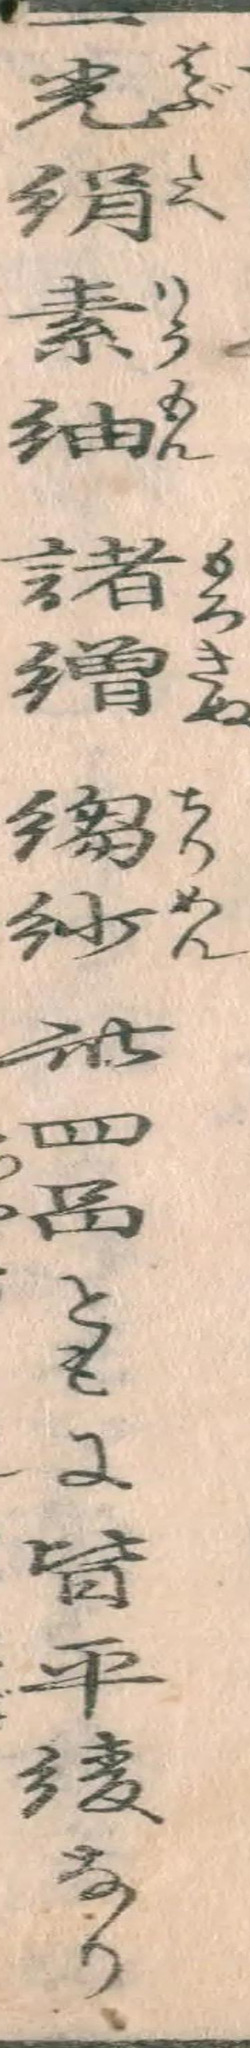一光絹素紬諸繒縐紗此四品ともに皆平綾なり
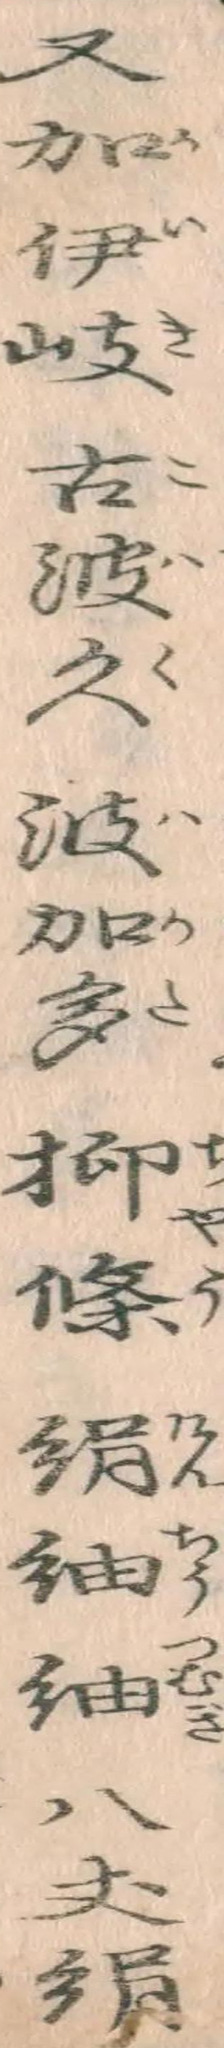又加伊岐古波久波加多柳条絹紬紬八丈絹
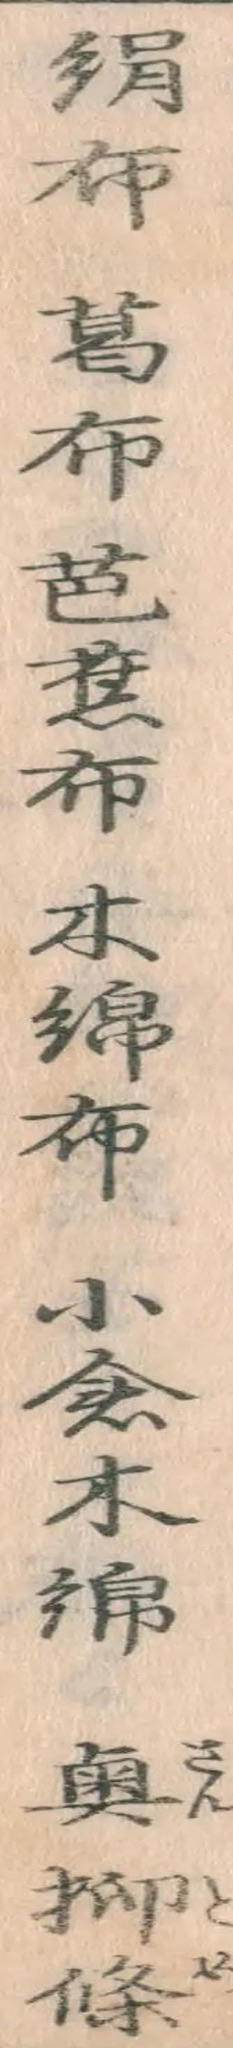絹布葛布芭蕉布木綿布小倉木綿奥柳条
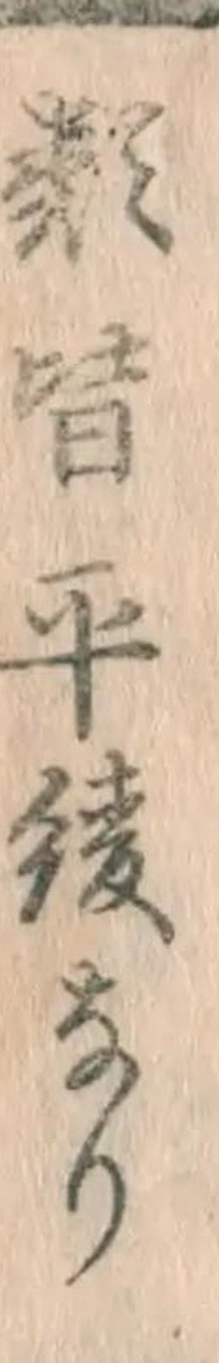類皆平綾なり

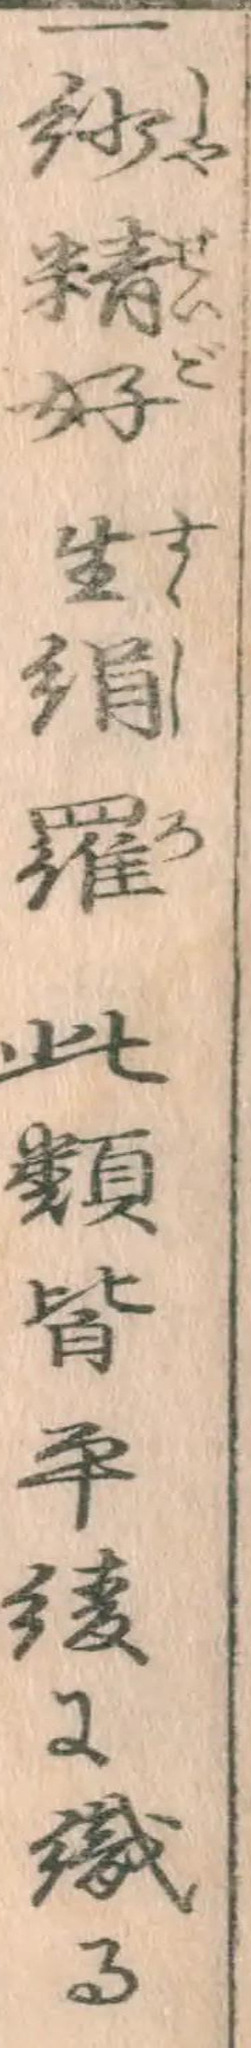一紗精好生絹羅此類皆平綾に織る
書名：機織彙編 5巻. [2]
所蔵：国立国会図書館 National Diet Library, JAPAN
